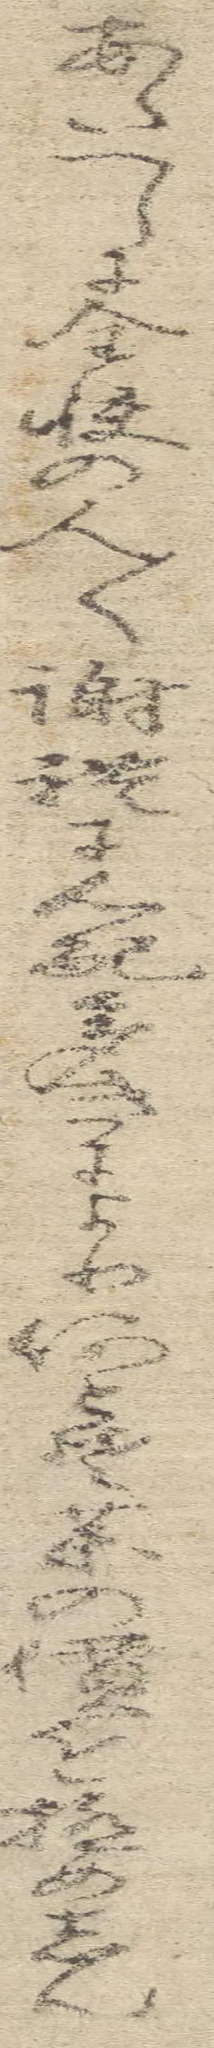あたへしに全快の人々謝礼に心配多きにより何とそ薬の價をきめしん
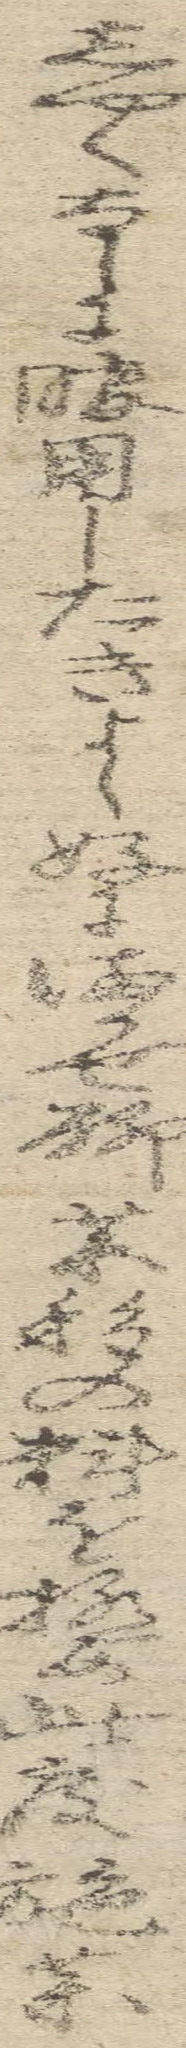しやくなしに服用したきよし好にまかせ聊薬移の料を極め此度施薬
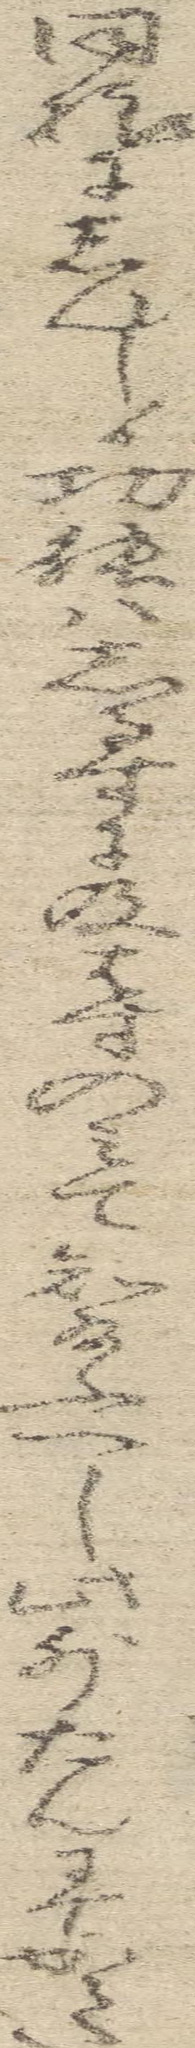同様にしんし候功能はしるすに及はすのみて知給ふへし此外たんにてからた
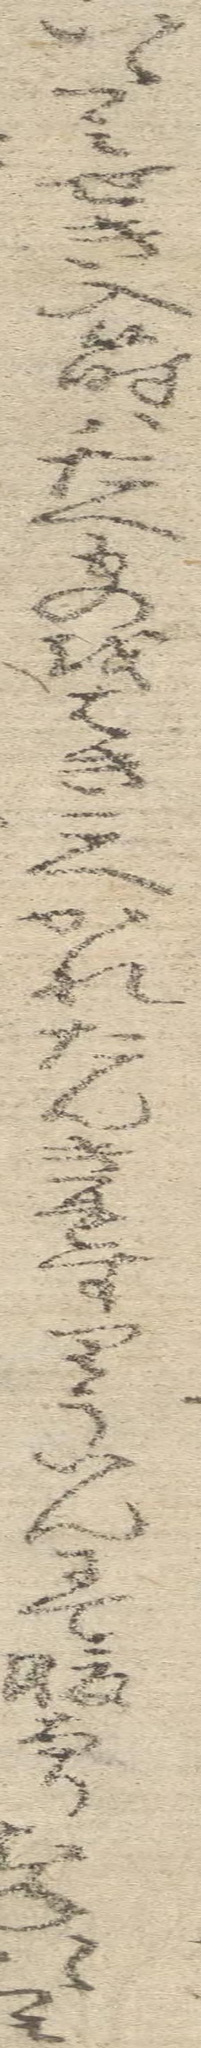いたみせき入候時はたへものをはきこへかれたんきれすりういんにて腹なりむねいたみ
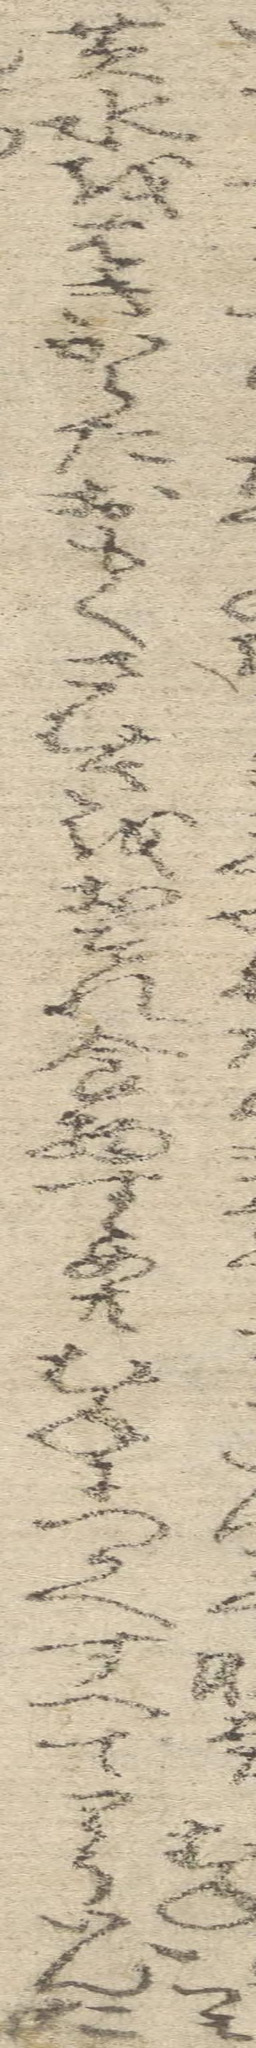黄水をはきからたおもくさむさをおそれ食物すゝめ共むねにつかへすへてりういんた
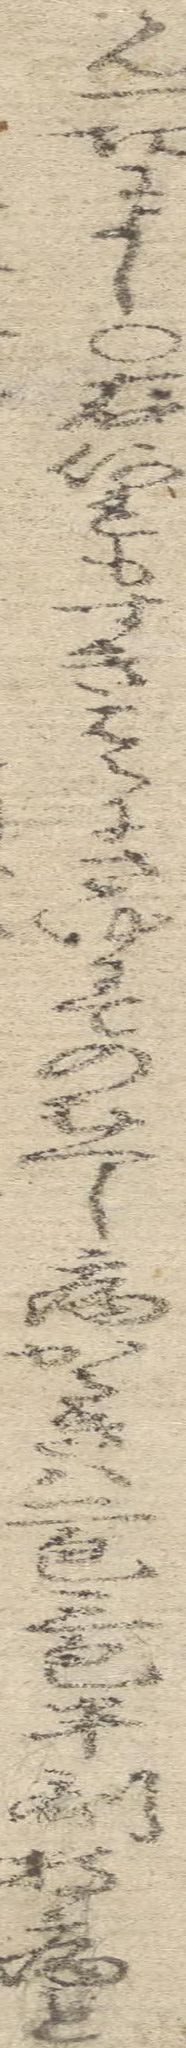ん一切によし〇右何れもすきはらにさゆにてのむへし病かるきはニ包三包半劑持病と
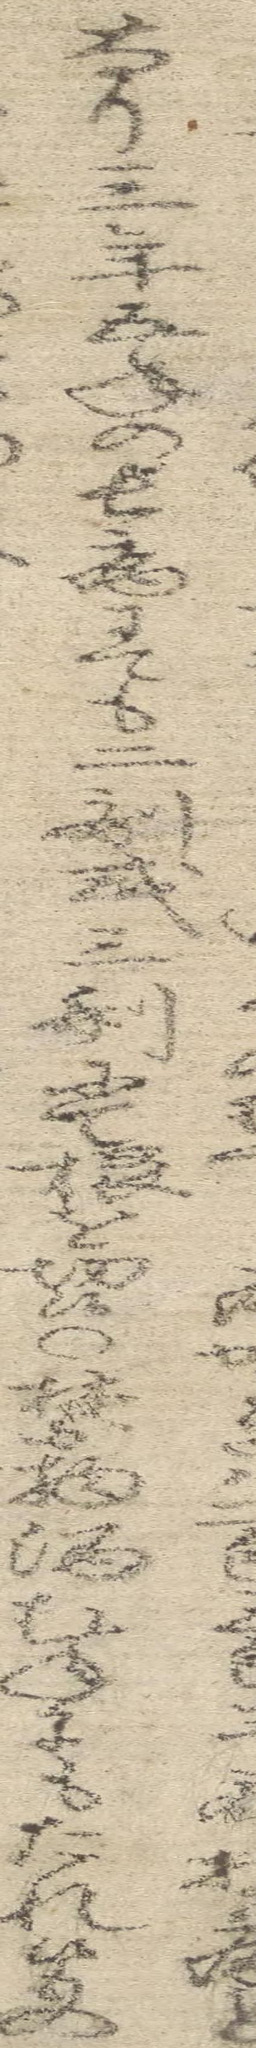なり三年五年の長病にても二剤或三剤にて根を切候〇禁物酒むねにもたれ候もの
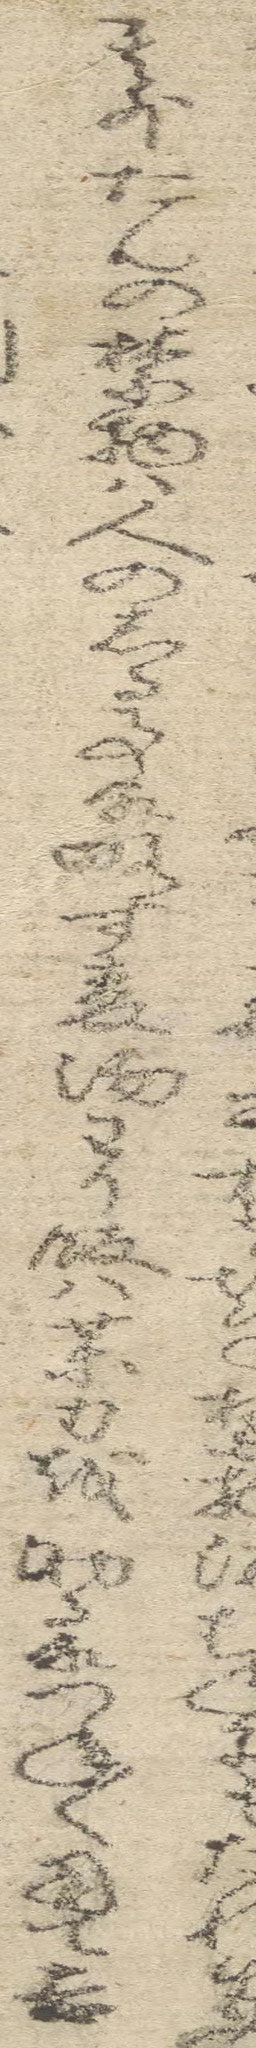其外たんの禁物は人のしる事故略す麦湯わり飯は薬力を助る故つね〳〵用て吉
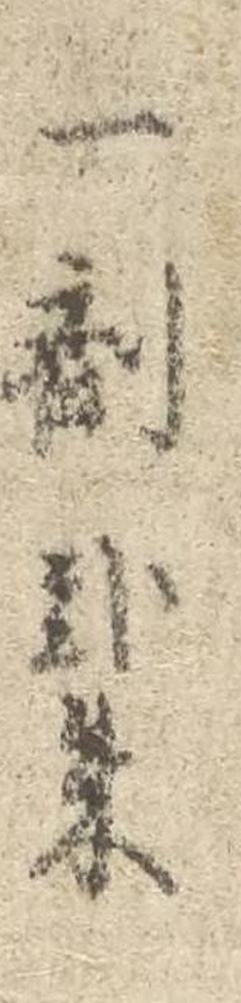一剤弐朱
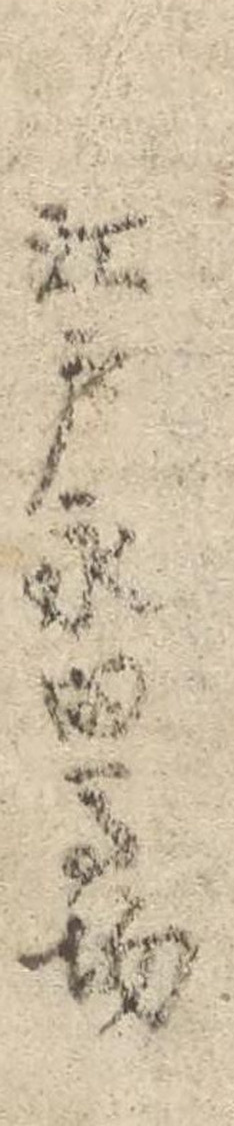江戸永田馬場
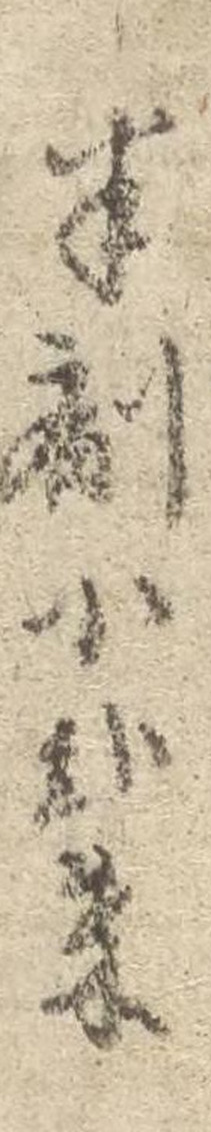半剤小弐朱
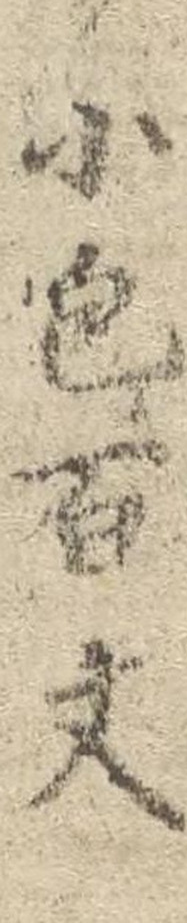小包百文
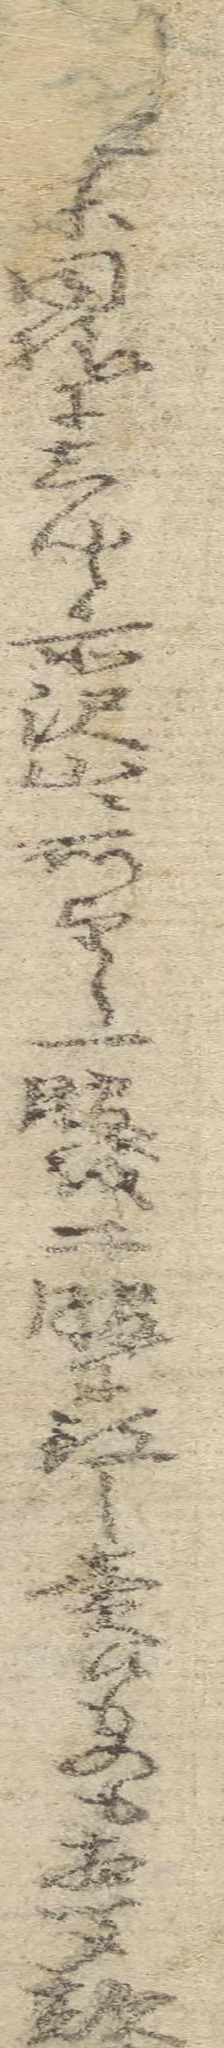同様にしんし候所沢山に所望し一服を二服に致し売候ものも相聞欺ケ
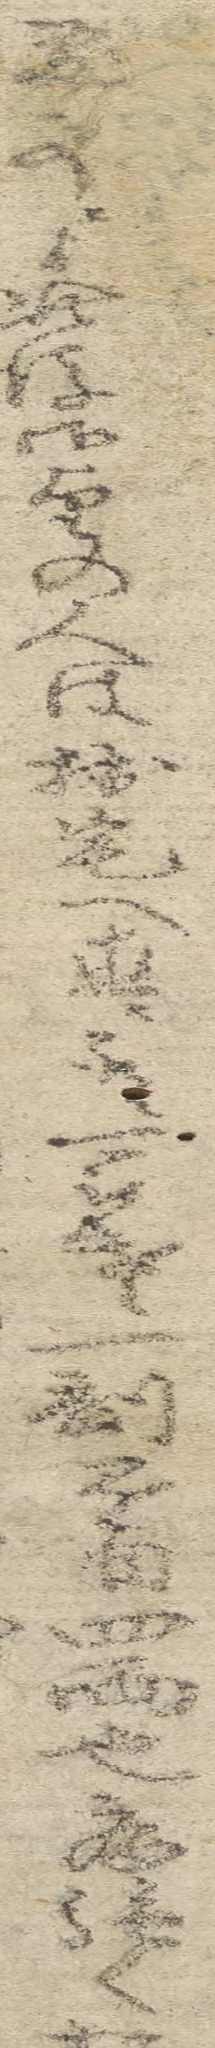敷事に候此後御望の人は拙宅へ直に取に可被遣候一剤懸目四両也病強くおこ
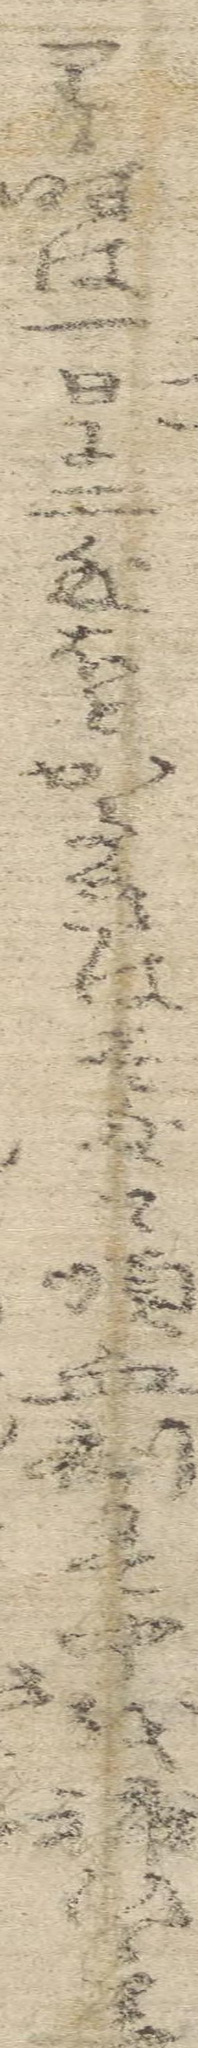り候時は一日に二匁ほとかるきは一匁ツヽ順血剤にて中を補ひ候
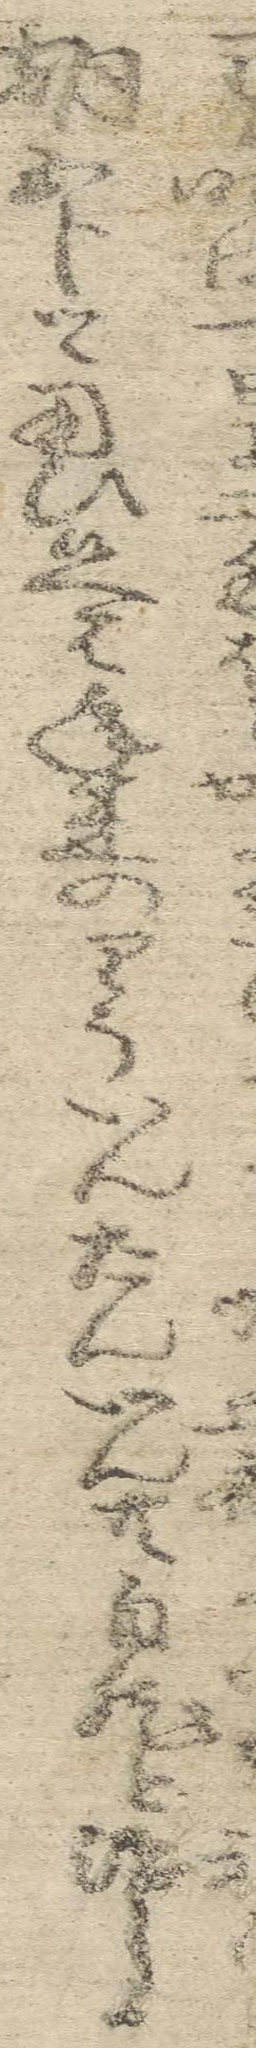朝五分つゝ用ひ候へは年来のりういんたんいん共自然と治し候
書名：浪華薬種問屋能書張交帖. 二
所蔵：国立国会図書館 National Diet Library, JAPAN
